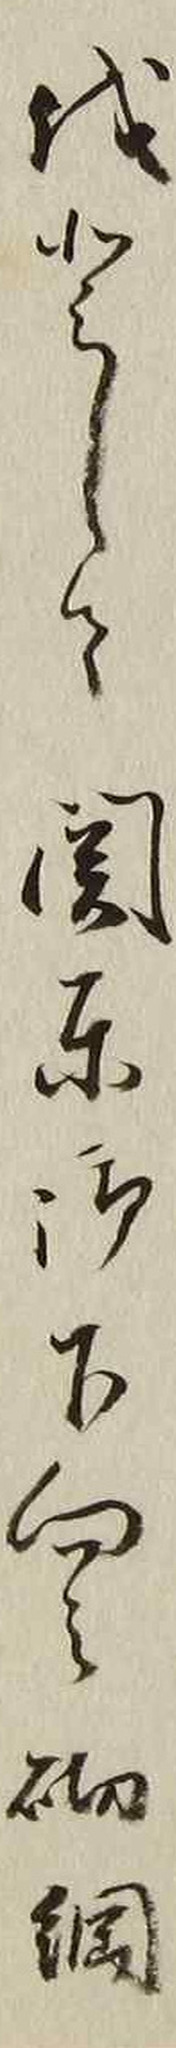伐として関東御下向之砌綱
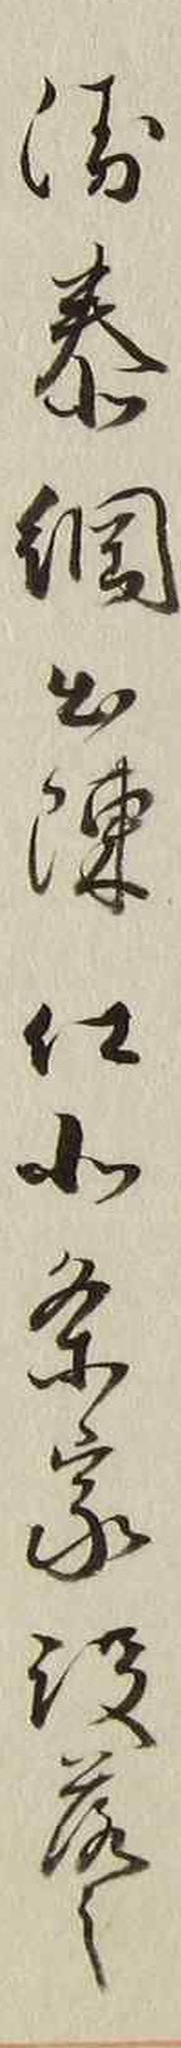衛泰綱出陣仕北条家没落之
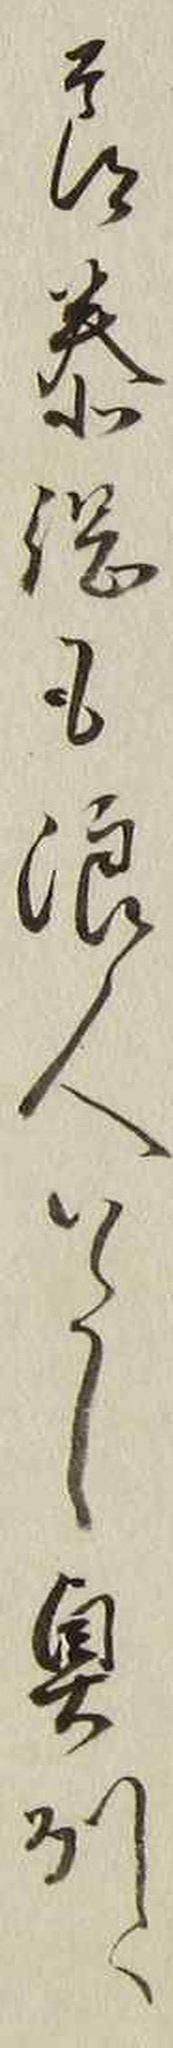節泰綱も浪人いたし奥州へ
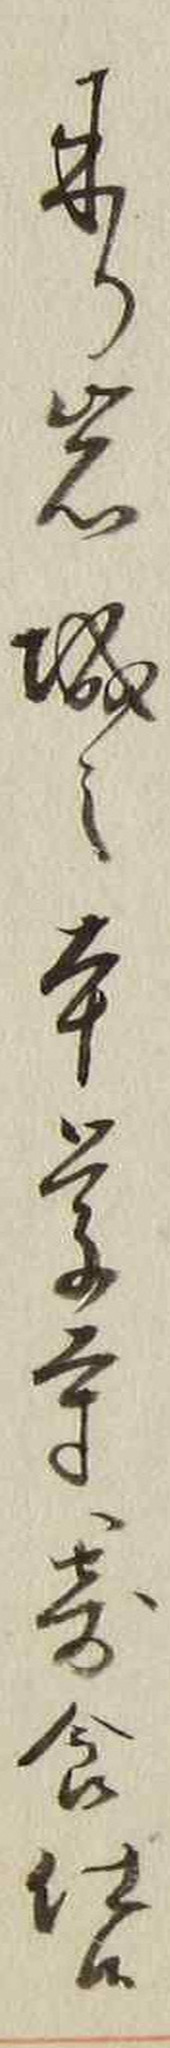来り岩城之本学寺へ寄食仕候
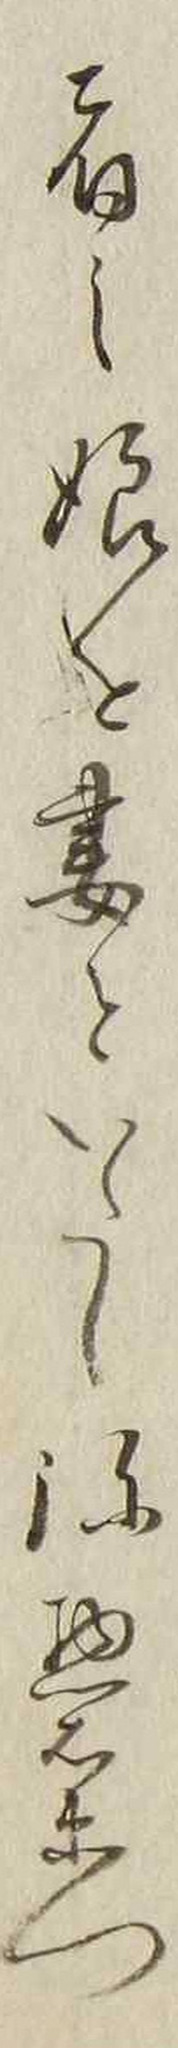者之娘を妻といたし弥惣右衛門

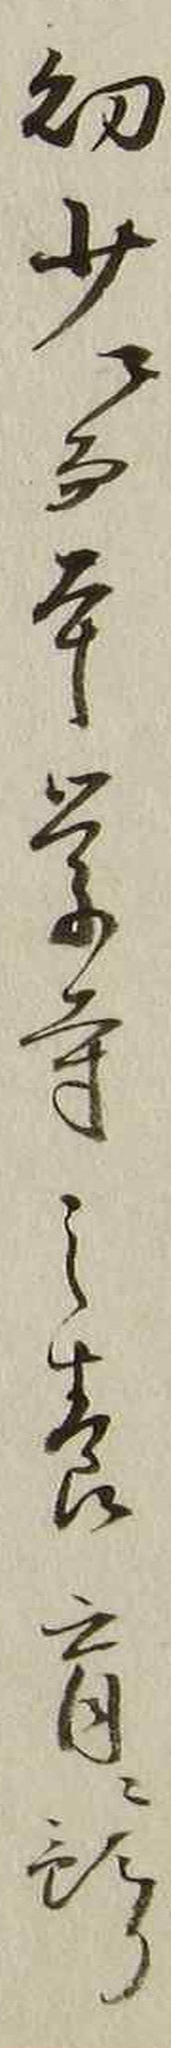幼少に而本学寺之養育に預り
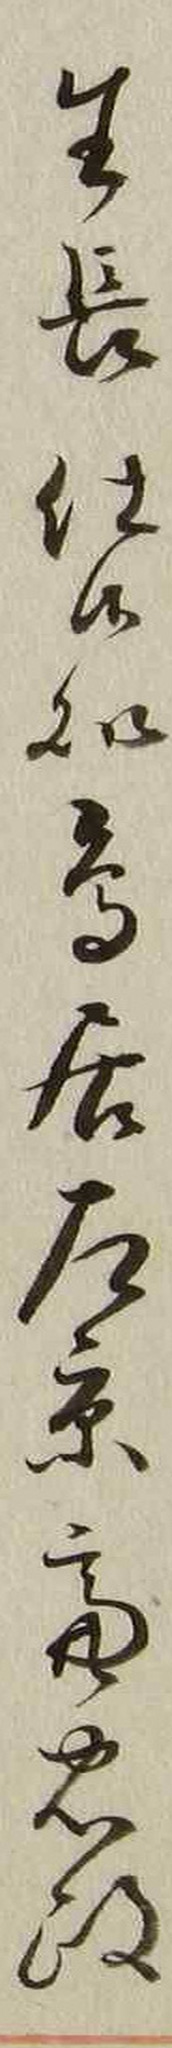生長仕候処鳥居左京亮忠政
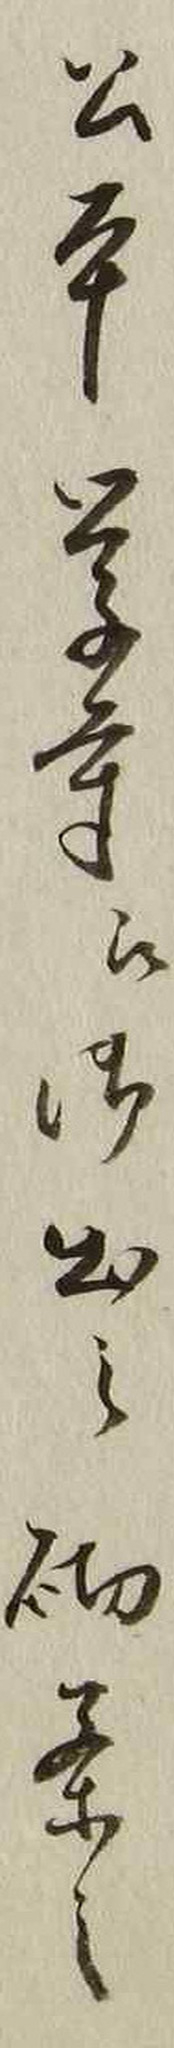公本学寺江御出之砌茶之
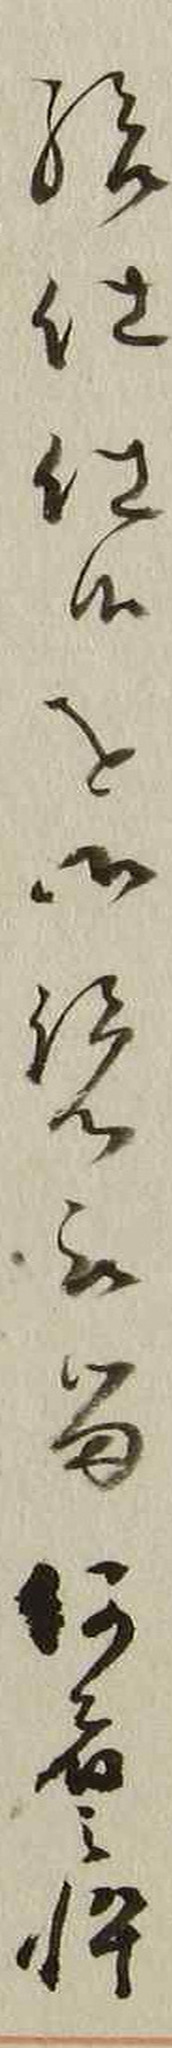給仕仕候を御覧留何者之忰
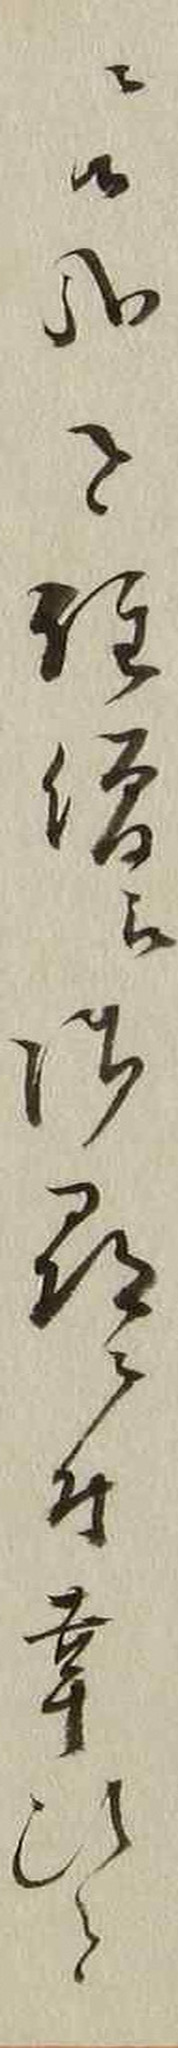に候哉と住僧御江御尋に付幸ひと
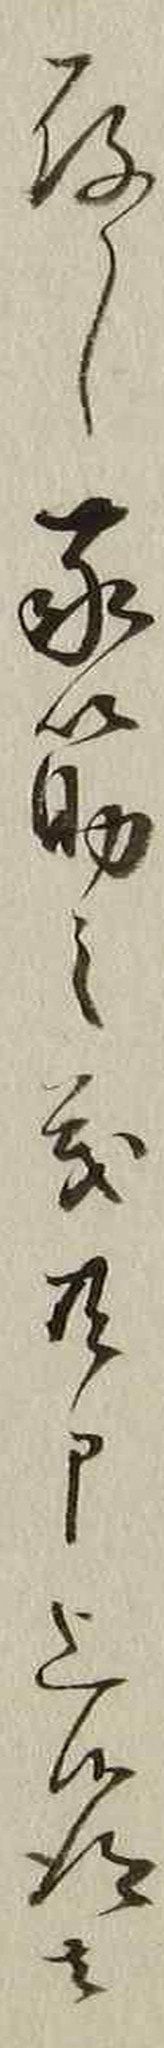存し家筋之義共申上候得は
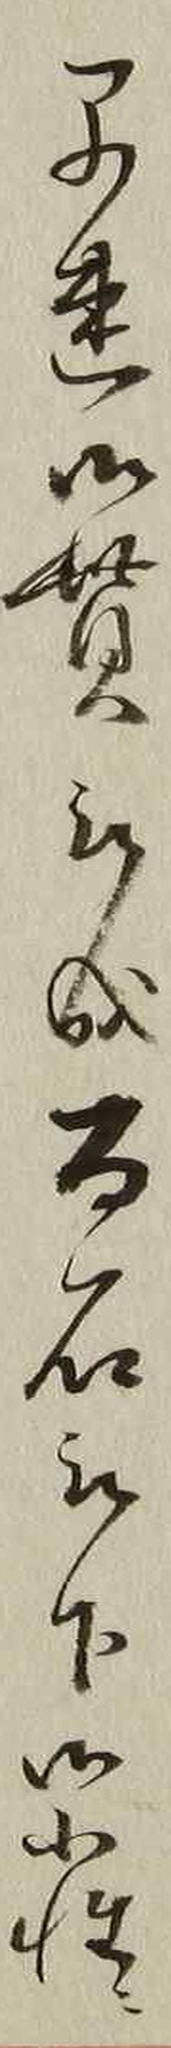早速御貰被成百石被下御小性に
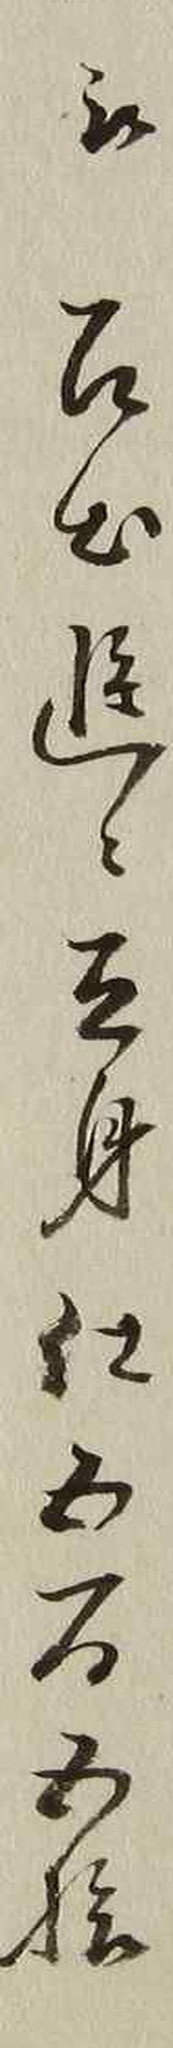被召出追々立身仕五百五拾
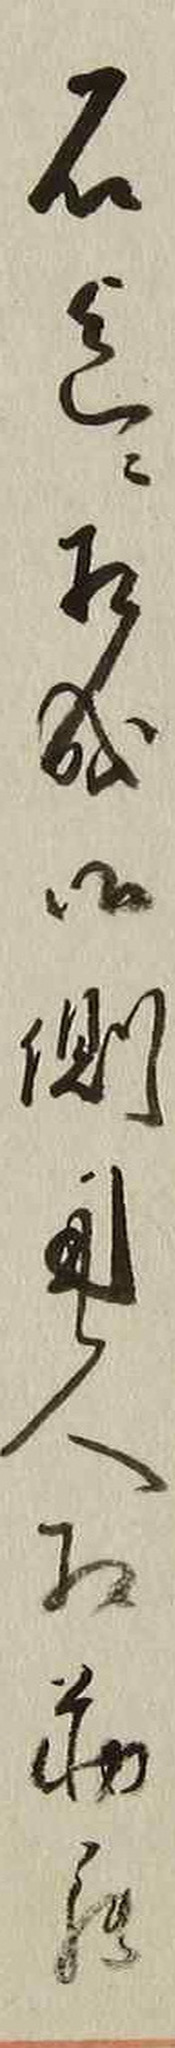石迄に相成御側用人相勤罷
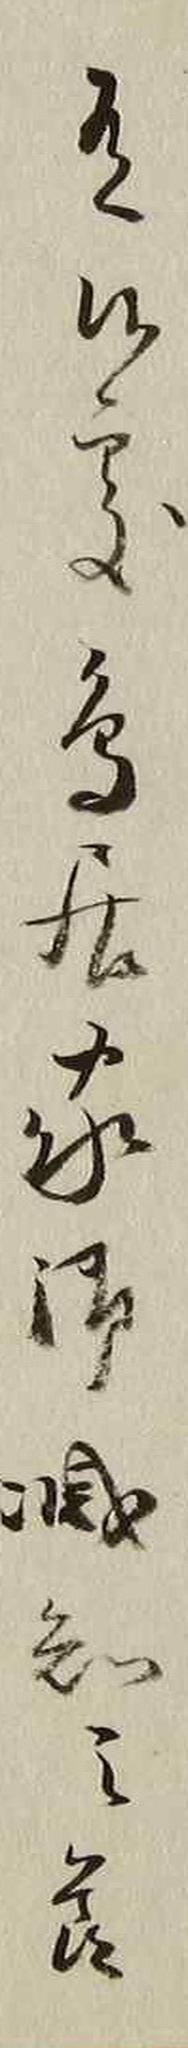有候処鳥居家御減知之節
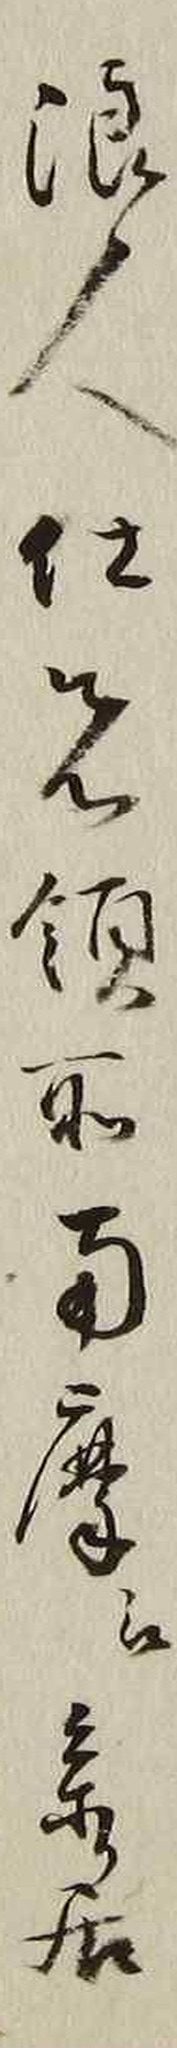浪人仕先領所南摩江参り居
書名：諸士系譜　巻之159　な之部1
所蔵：会津若松市立会津図書館
